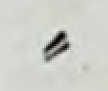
„
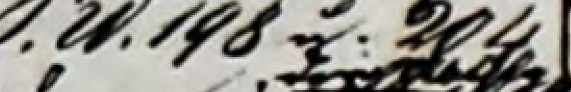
P.W. 198 u. 204
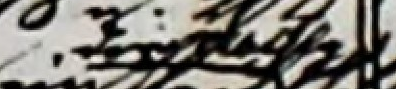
der???
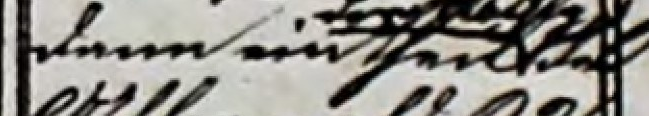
dann ein ???
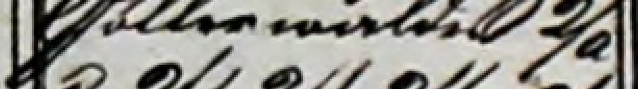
Götterwaldes 2/a
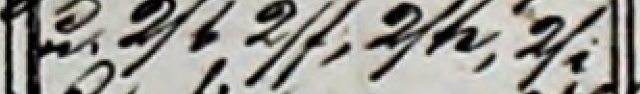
u. 2/b 2/f, 2/h, 2/i
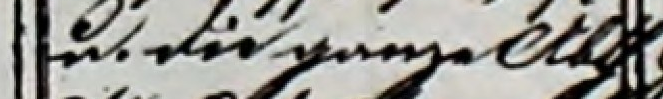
u. der ganze Abth
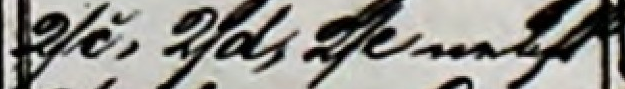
2/c, 2/d, 2/c nebst
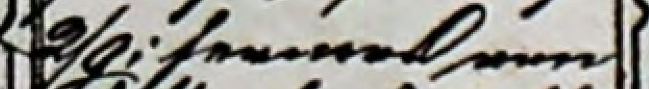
2/g; ferners von
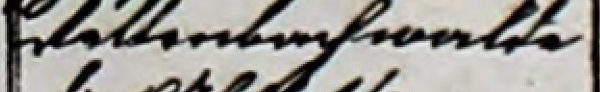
Dettenbachwalde
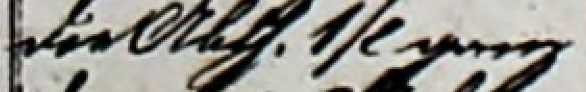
der Abth. 1/2 ganz
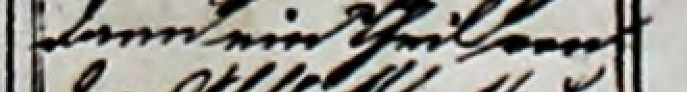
dann ein Theil von
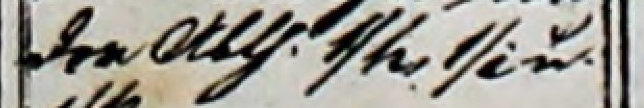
der Abth. 1/h. 1/i u.
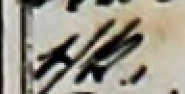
1/k.
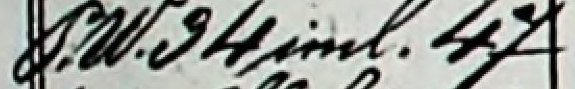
P.W. 34 incl. 47
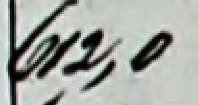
612,0
